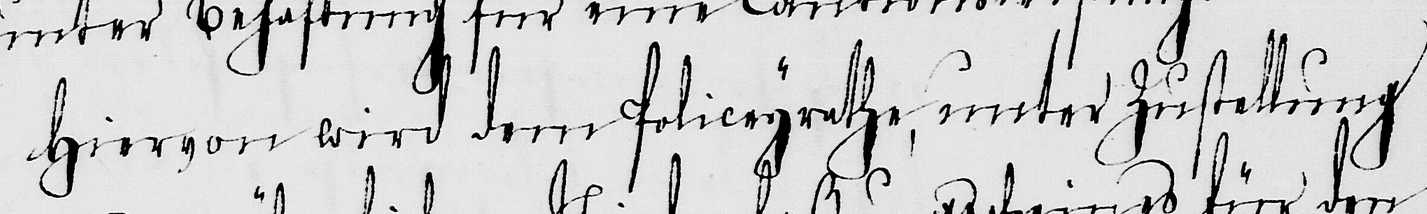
Hiervon wird dem Policeyrathe, unter Zustellung
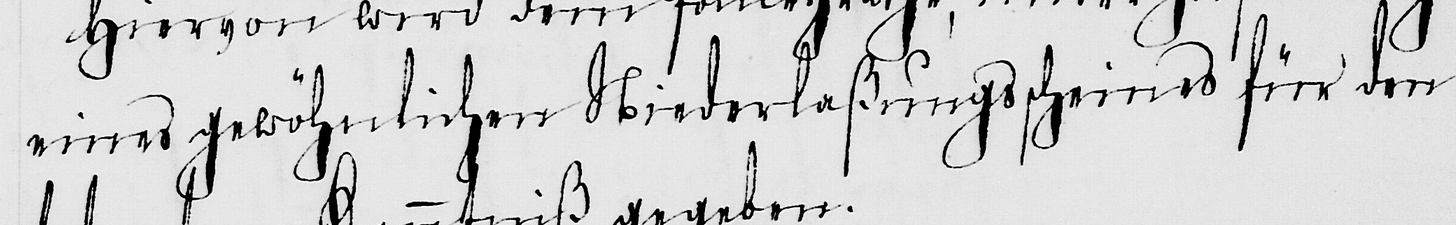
eines gewöhnlichen Niederlaßungsscheines für den
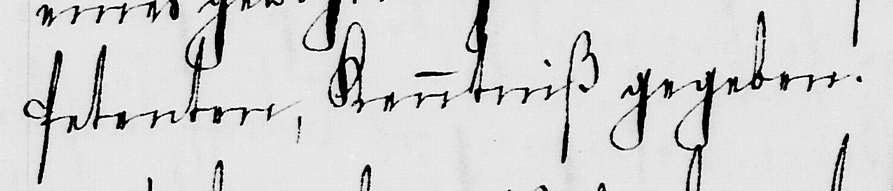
Petenten, Kenntniß gegeben.
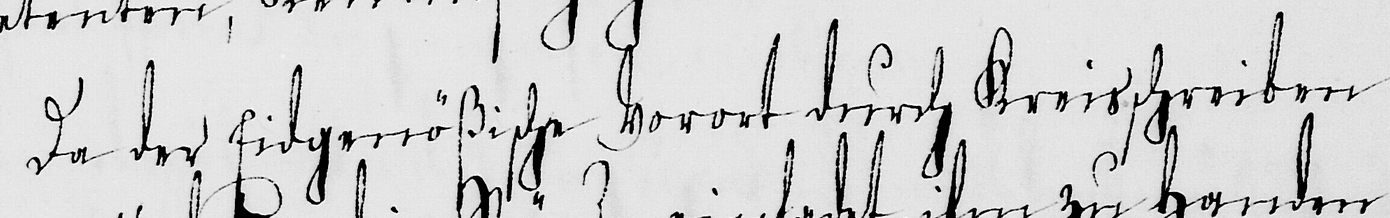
Da der Eidgenößische Vorort durch Kreisschreiben
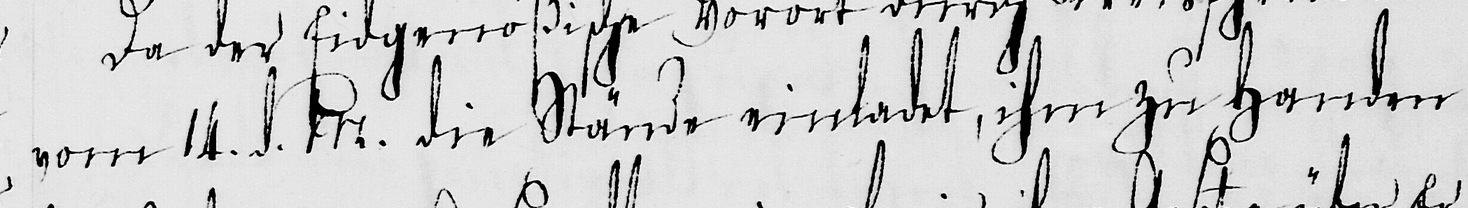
vom 14. d. M. die Stände einladet, ihm zu Handen
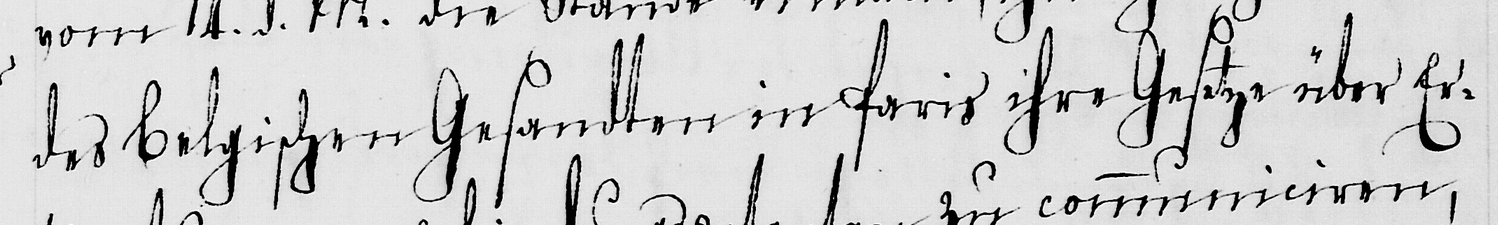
des Belgischen Gesandten in Paris ihre Gesetze über Er¬
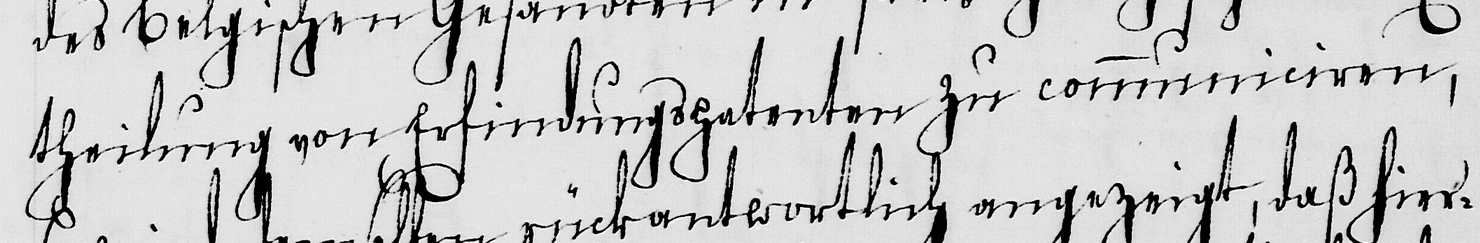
theilung von Erfindungspatenten zu communiciren,
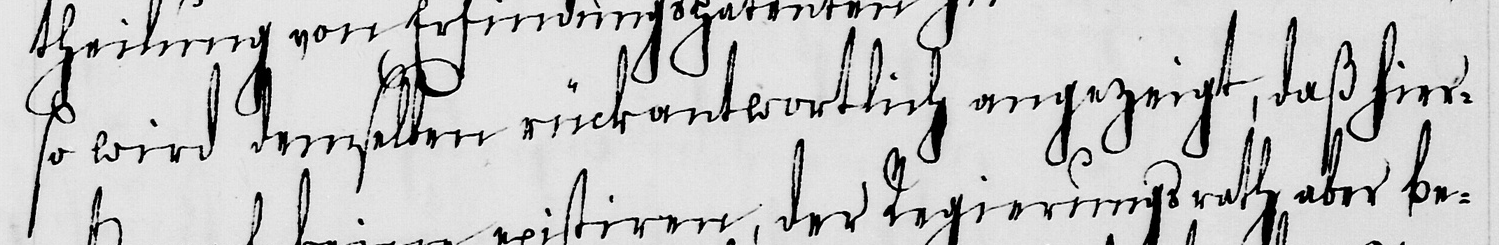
so wird demselben rückantwortlich angezeigt, daß hier¬
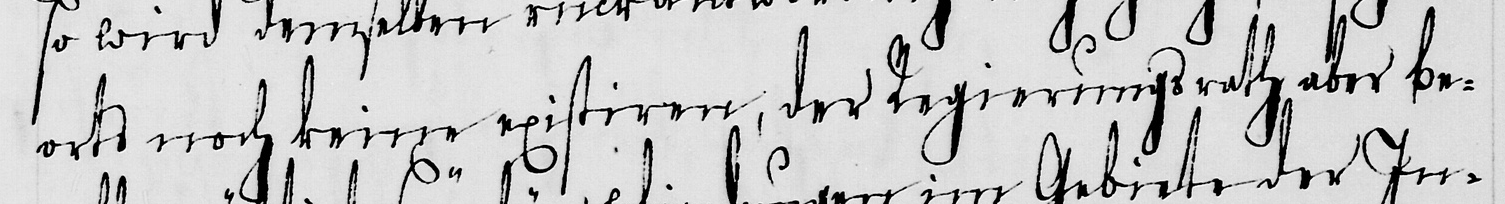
orts noch keine existiren, der Regierungsrath aber be¬
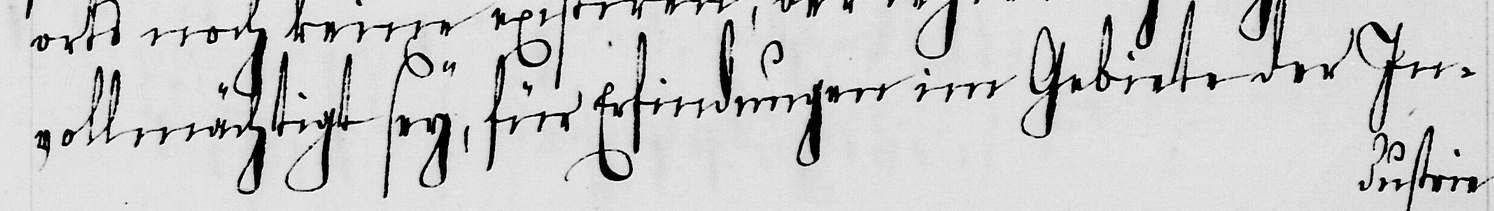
vollmächtigt sey, für Erfindungen im Gebiete der In-
